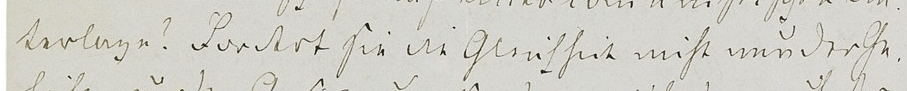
terlage? Fordert sie die Gleichheit nicht nur der Ge-
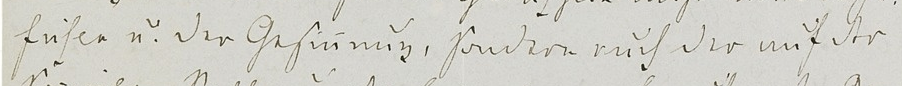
fühle u. der Gesinnung, sondern auch der auf der
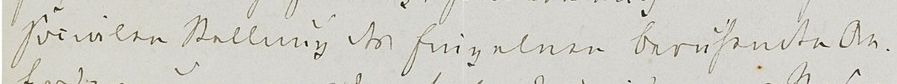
socialen Stellung des Einzelnen beruhenden An-
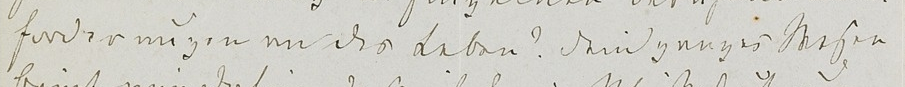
forderungen an das Leben? Dein ganzes Wesen
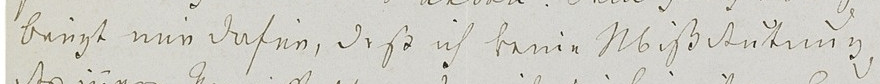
bürgt mir dafür, daß ich keine Mißdeutung
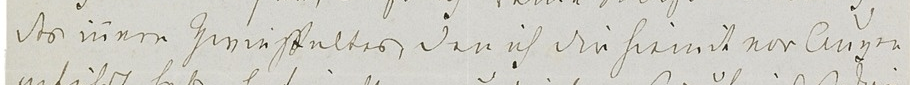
des innern Zwiespaltes, den ich dir hiemit vor Augen
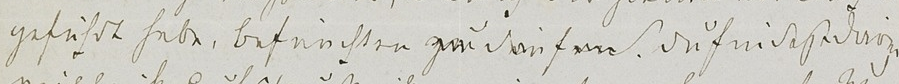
geführt habe, befürchten zu düarfen. Du findest darin
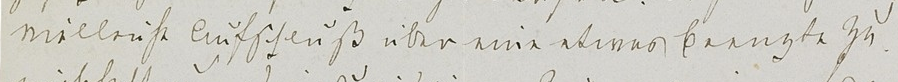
vielleicht Aufschluß über eine etwas beengte Zu-
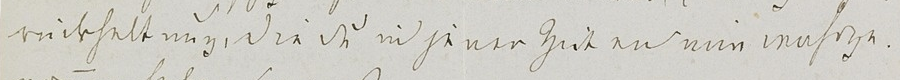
rückhaltung, die du in jener Zeit an mir wahrge-
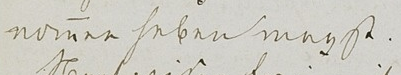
nommen haben magst.
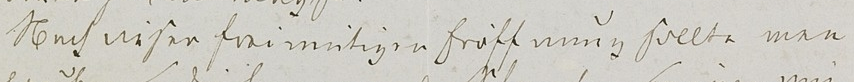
Nach dieser freimütigen Eröffnung sollte man
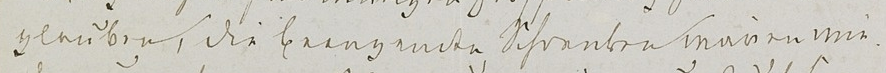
glauben, die beengenden Schranken wären wie-
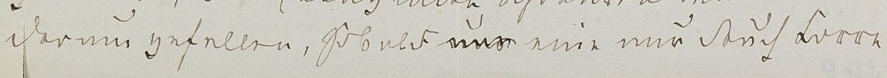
derum gefallen, sobald eine nur durch Corre-
